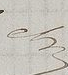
etc.
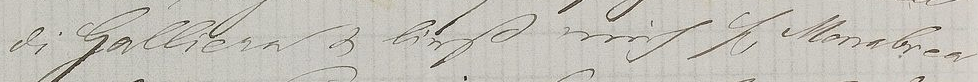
di Galliera & ließ mich H. Menabrea
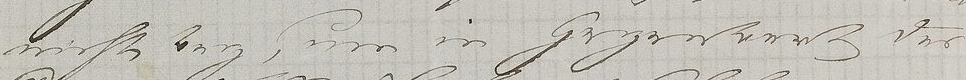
nicht weg, um in Gegenwart des
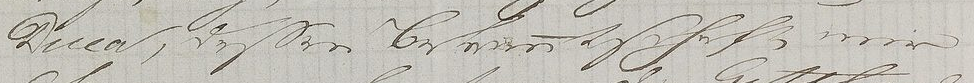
Duca, dessen Bekanntschaft mir
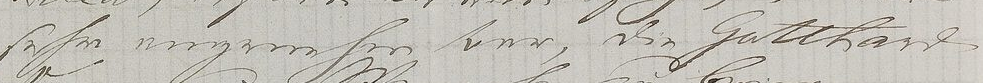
sehr angenehm war, die Gotthard--
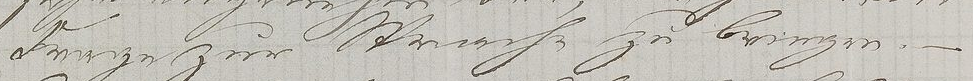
Frage zur Sprache zu bringen. –
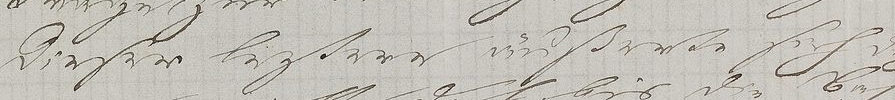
Dieser leztere äußerte sich
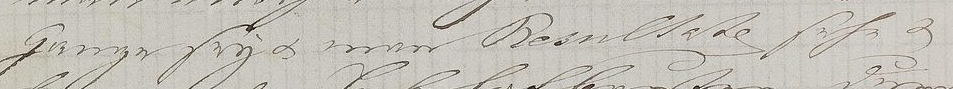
Gange sey & man Resultate sehe &
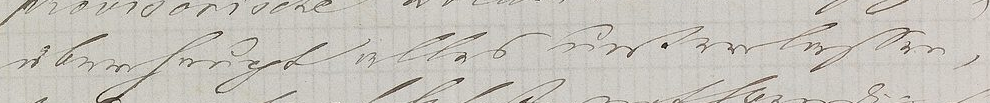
überhaupt alles unterlassen,
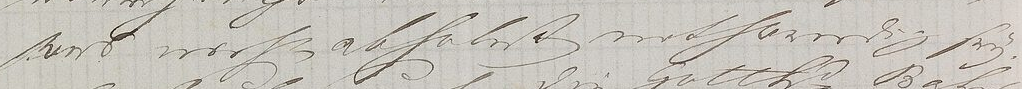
was nicht absolut nothwendig sey.
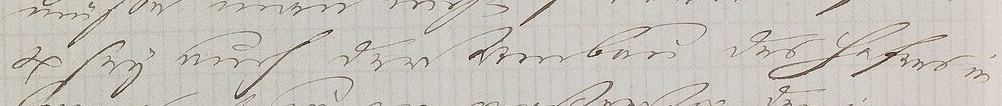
& sey auch der Umbau des Hafens in
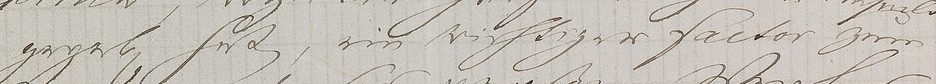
gegeben hat, ein wichtiger Factor zum
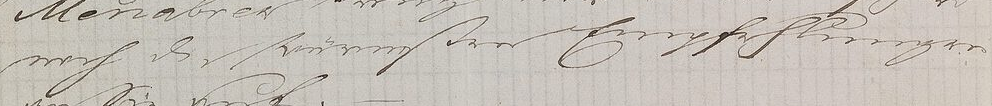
noch die wärmsten Empfehlungen
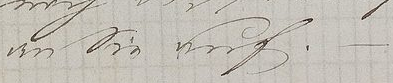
an Sie auf.
